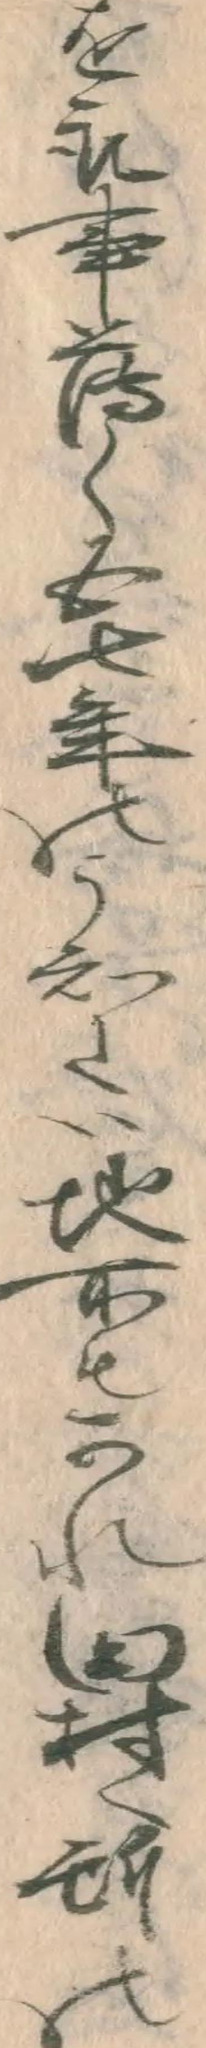を取事薄く五七年のうちには地所もかれ田村へ所の
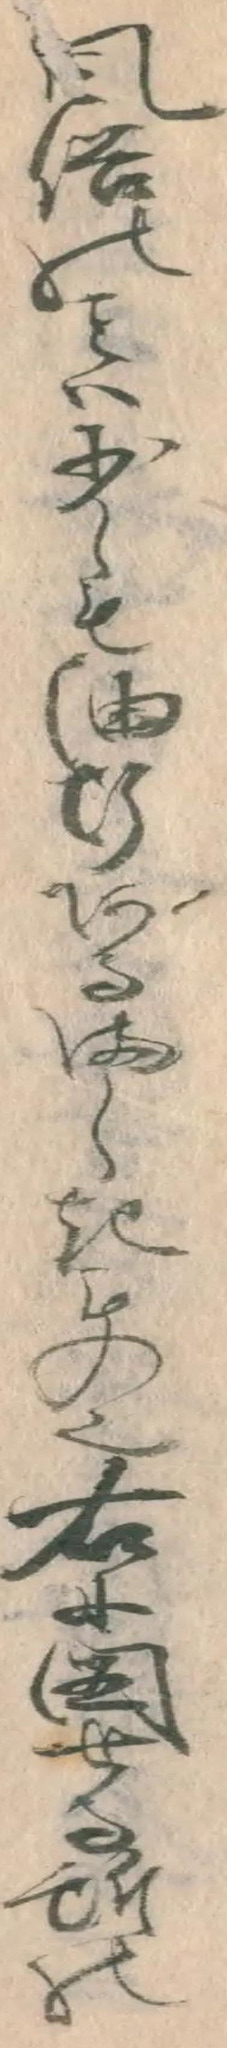風俗のことは少しも油断あるましきもの也右に図せる所の
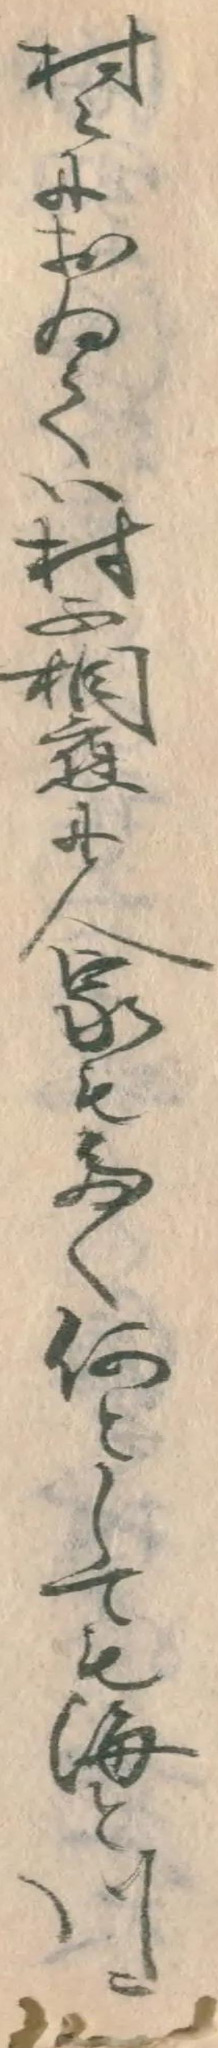村々におゐては村不相応に人家も多く何としても海と川に
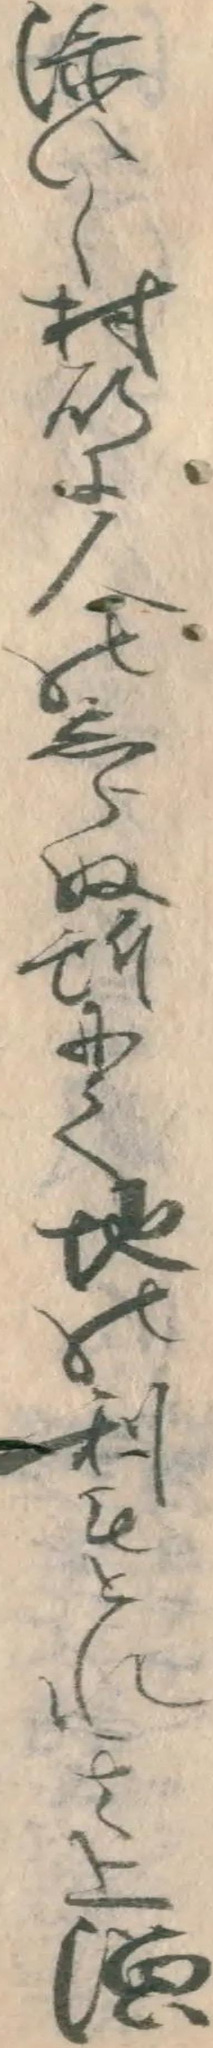添ひて村行に人のしらぬ所にて地の利もとれ其上漁
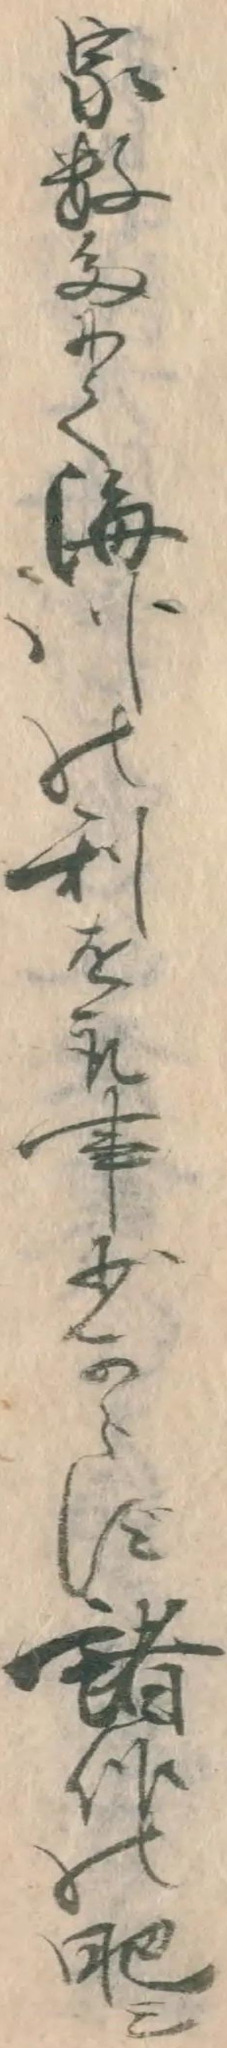家数多にて海川の利を取事少からず諸作の肥し

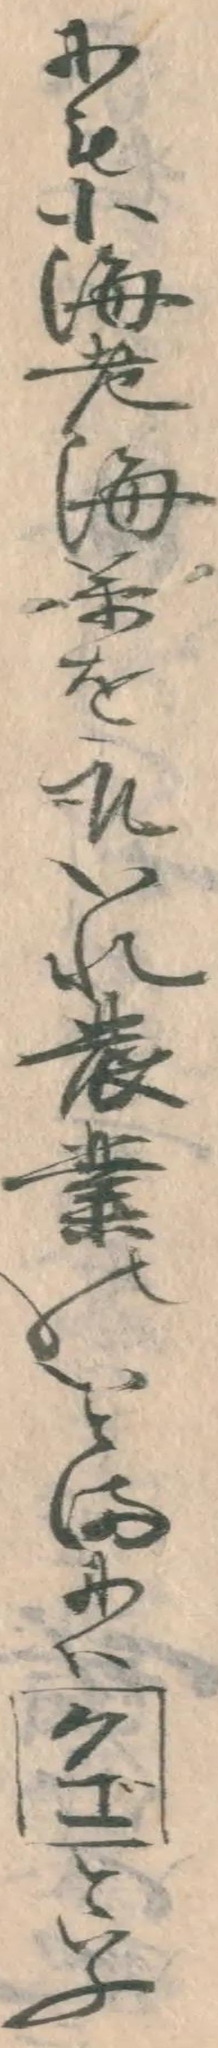にも小海老海草を取いれ農業のいとまには「クゴ」といふ
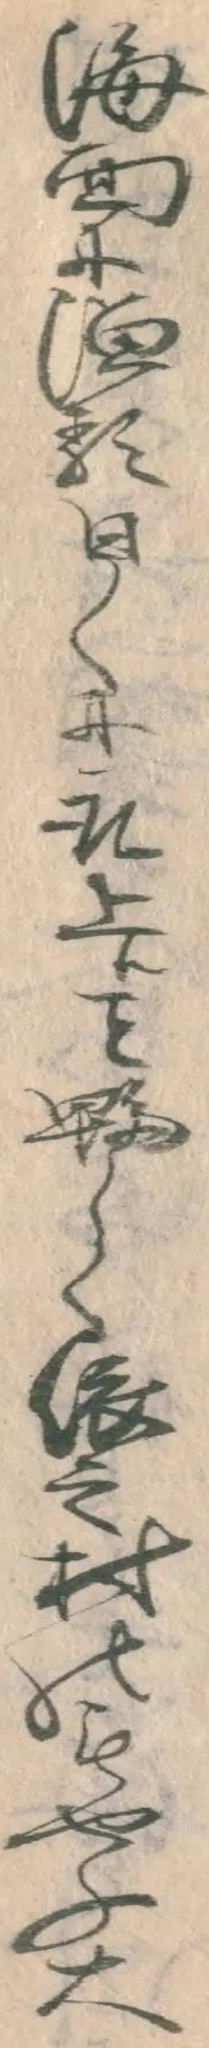海面に漁類日〳〵に取上ること夥しく依之村のもやふ大
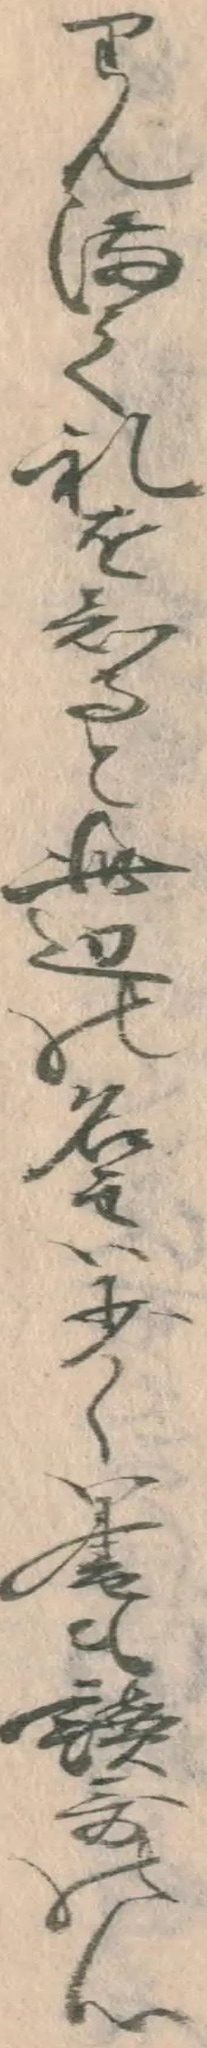りん満て礼を知ると此辺の名主は少しは書も読哥の心
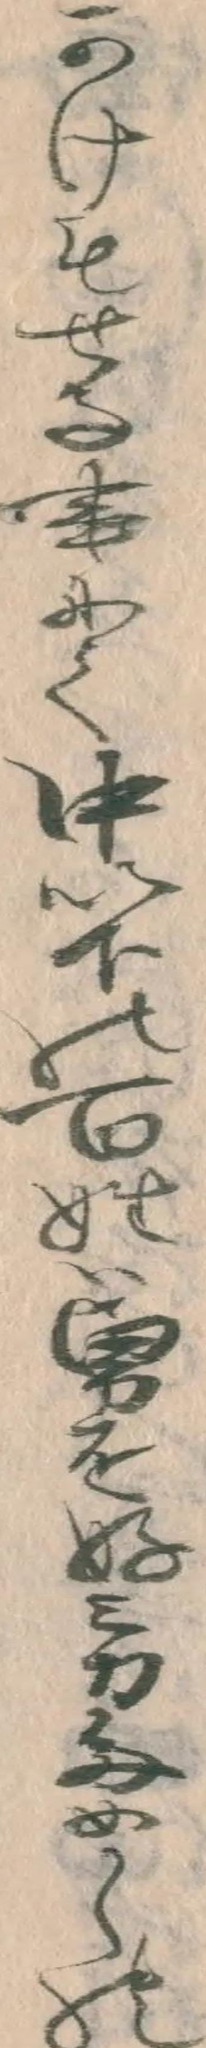かけもせる事にて中以下の百姓は勇を好み力ためしの
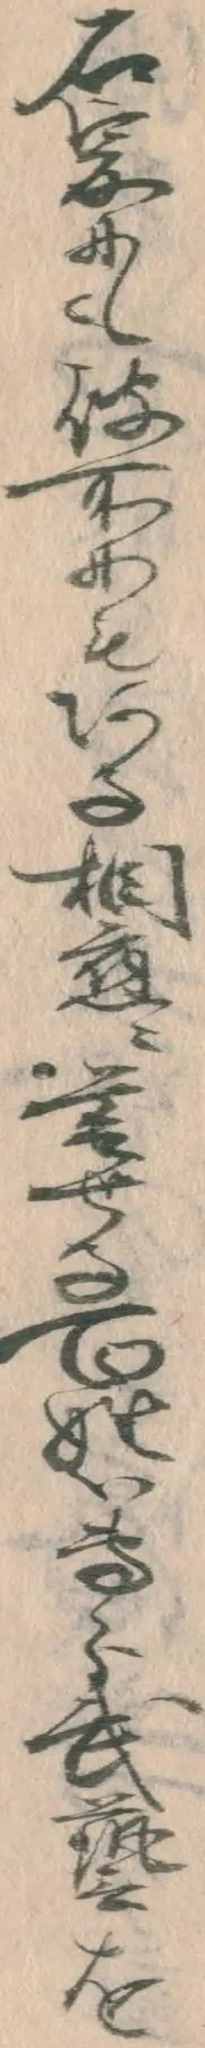石爰にも彼所にもある相応に暮せる百姓は専ら武芸を
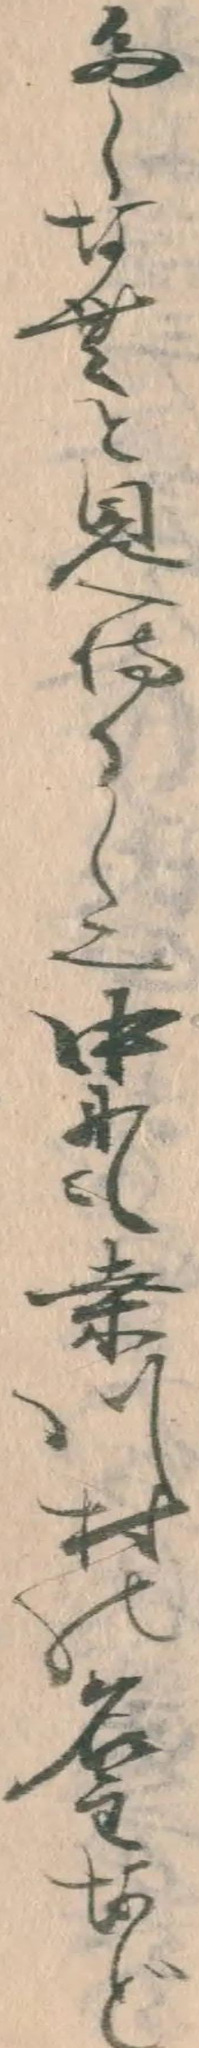たしなむと見へ侍りし也中にも桑川村の名主など
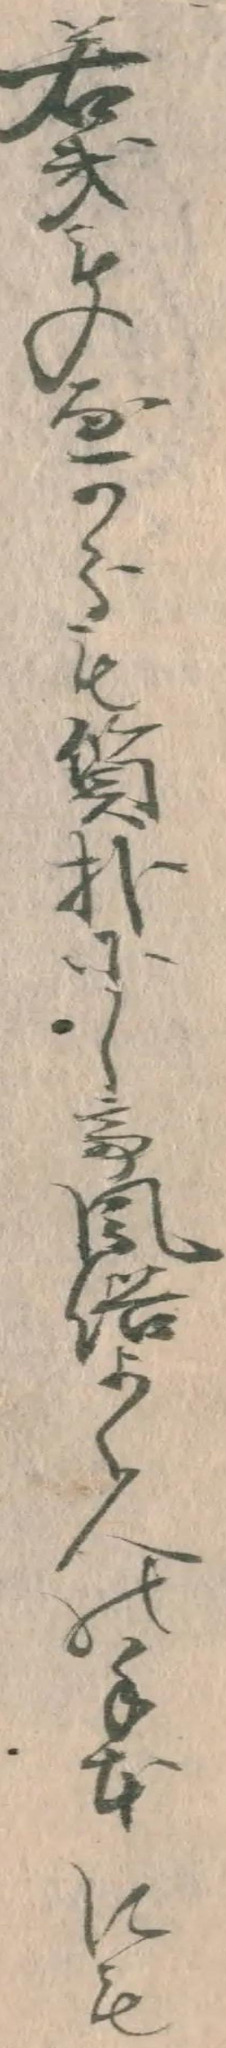若きものなからも質朴にして風俗よく人の手本にも
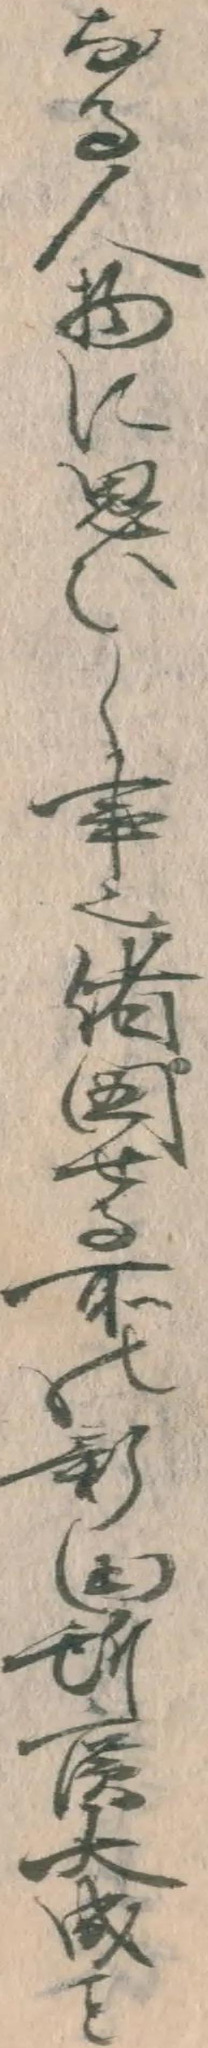なる人物に思ひし事也借用せる所の新田所広大成こと
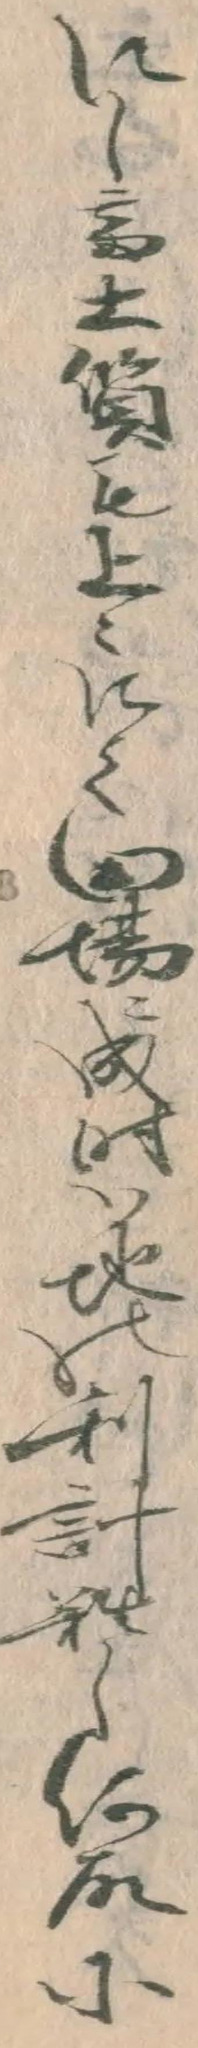にして土質も上々にて田場に成時は地の刻計難し何故に
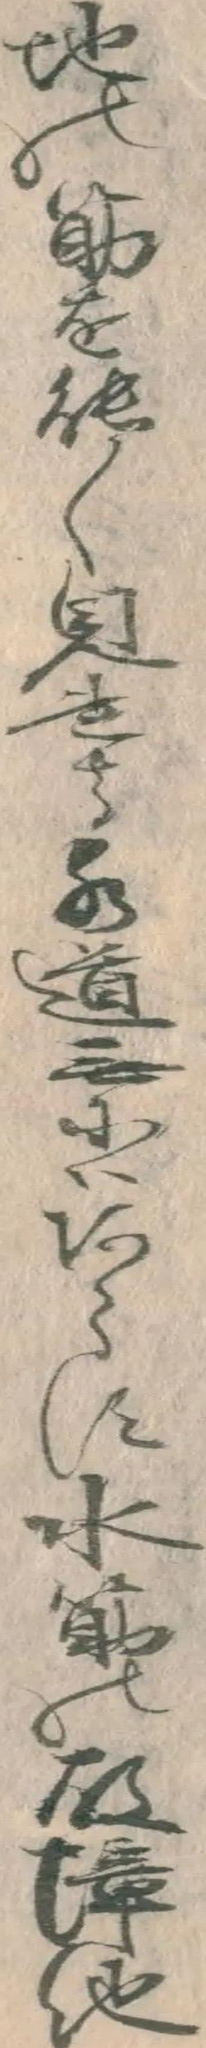地の筋を能〳〵見れは水道無にはあらす水筋の故障他
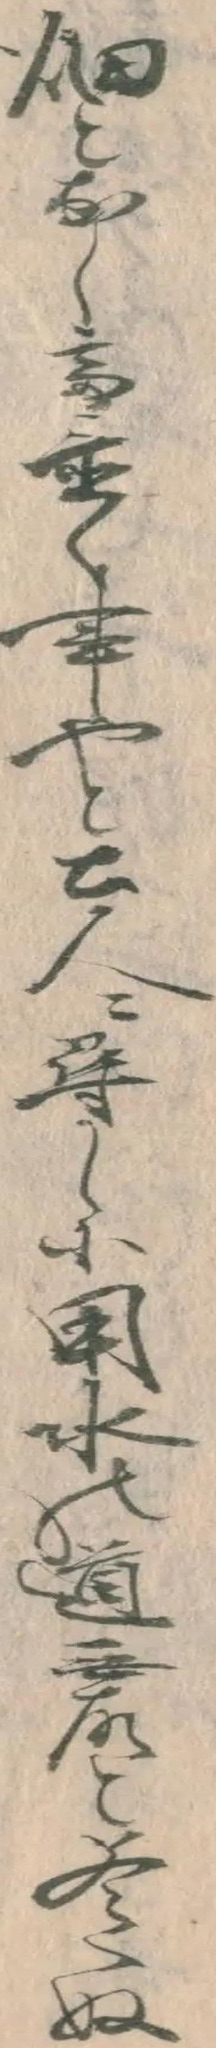畑となして置く事やと土人に尋しに用水の道無故と答へぬ
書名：四神地名録 6巻. [4]葛飾郡
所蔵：国立国会図書館 National Diet Library, JAPAN
